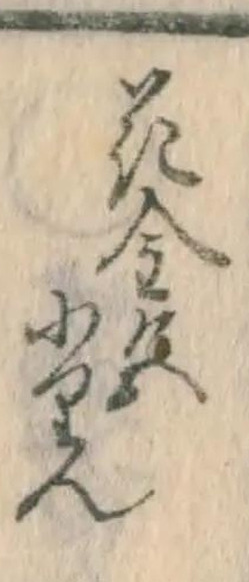小りん
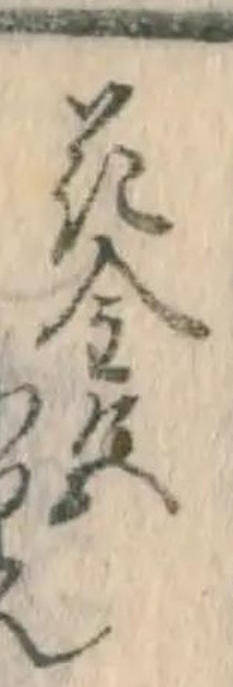花金色
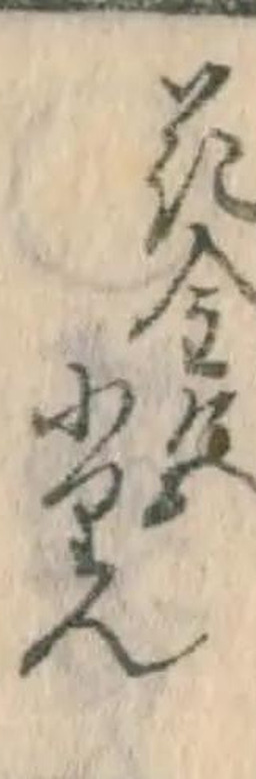小りん
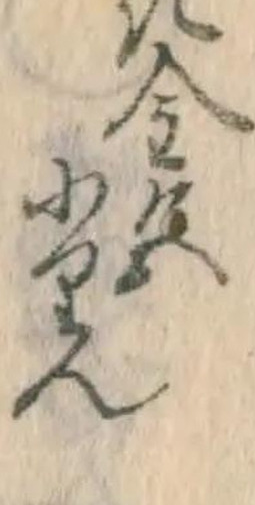小りん
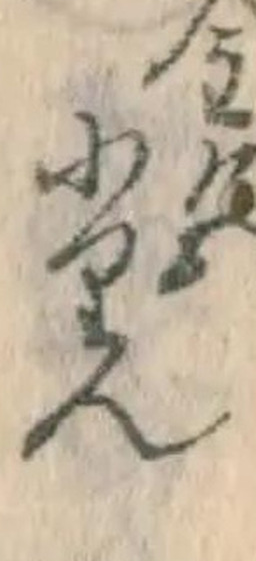小りん
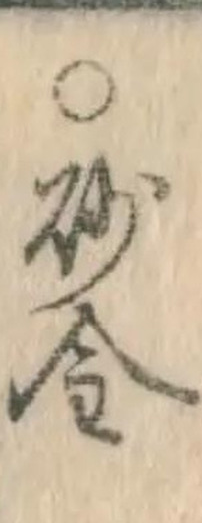〇砂金
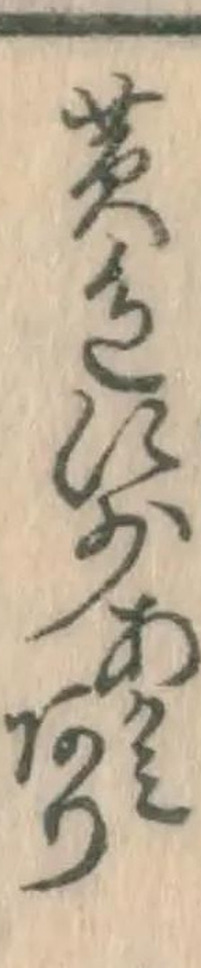黄色に少しあかみ
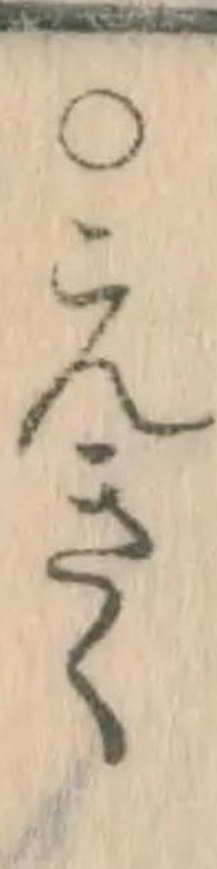〇こんきく
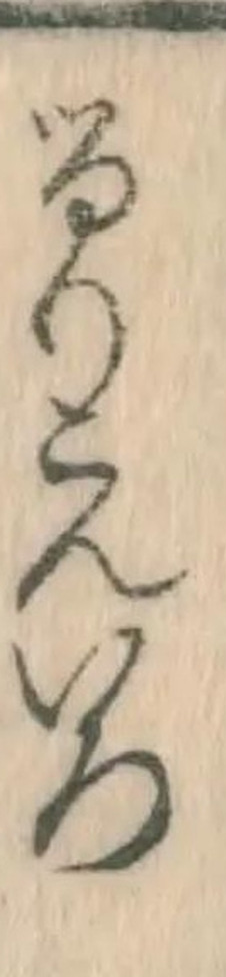るりこんいろ
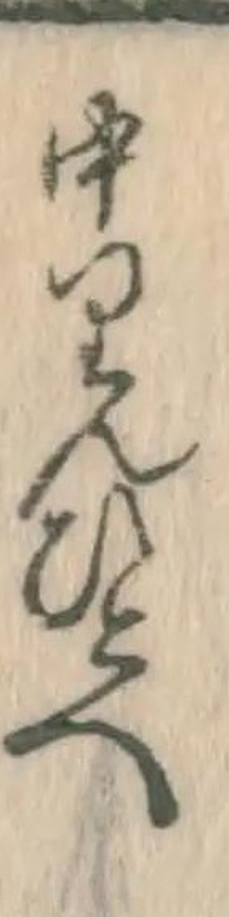中りんひとへ
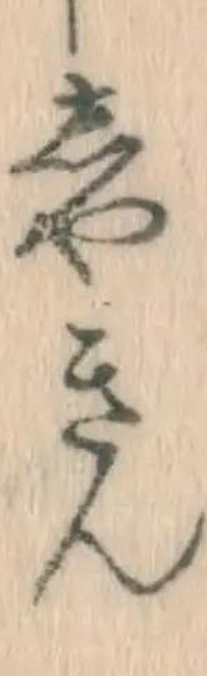しやきん
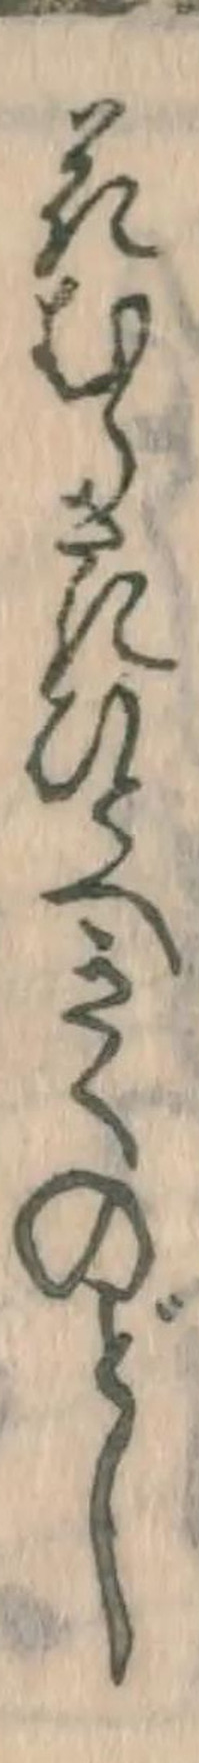花むらさきにひとへきくのごとく
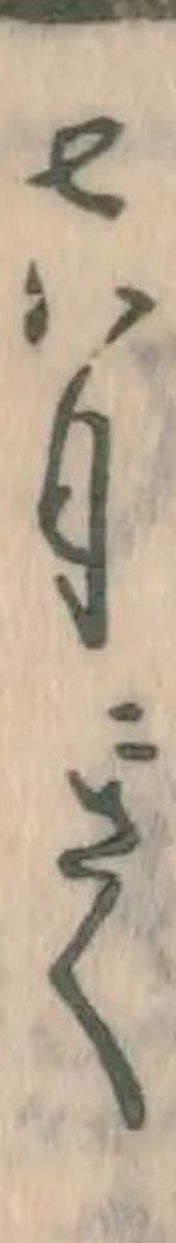七八月にさく

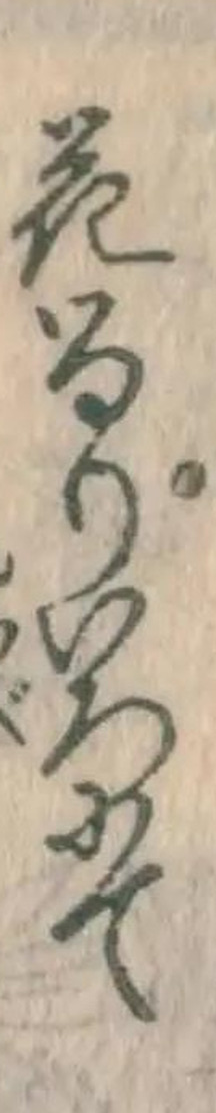花るりいろにて
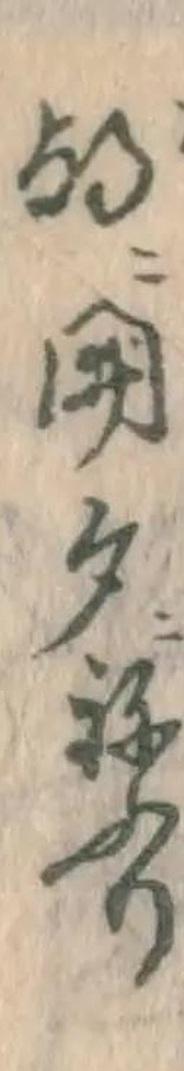朝に開夕ねふり
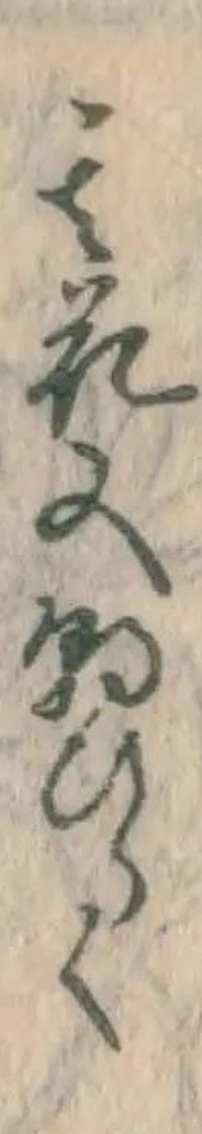其花又朝ひらく
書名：艸花繪前集. [3]
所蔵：国立国会図書館 National Diet Library, JAPAN
